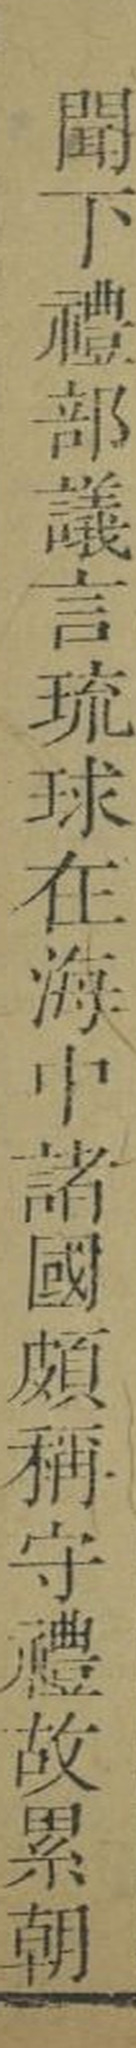聞下礼部議言琉球在海中諸国頗称守礼故累朝
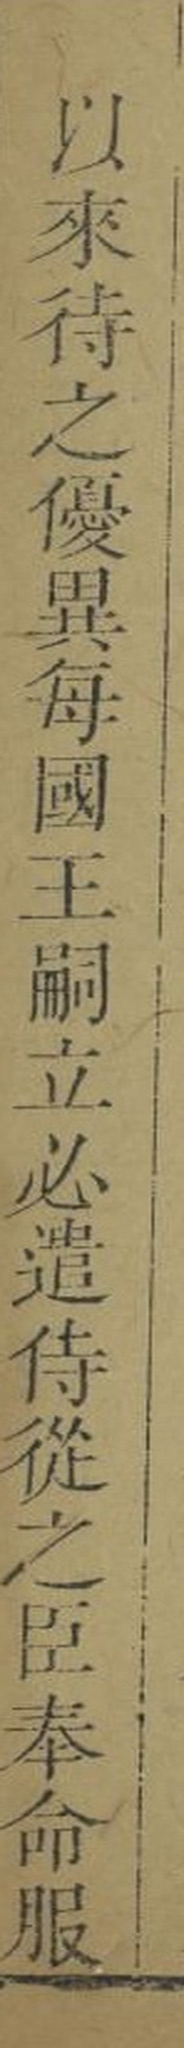以来待之優異毎国王嗣立必遣侍従之臣奉命服

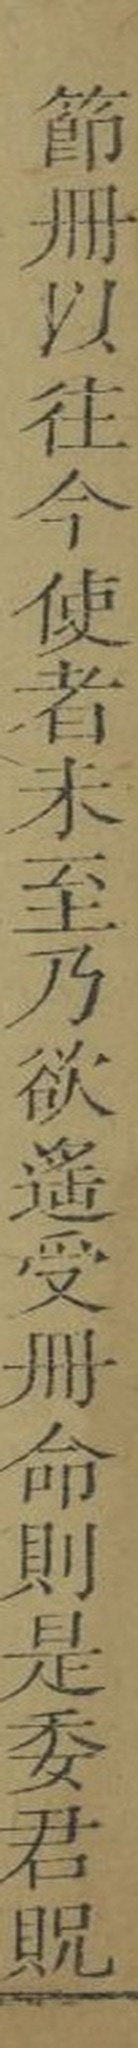節冊以往今使者未至乃欲遥受冊命則是委君貺
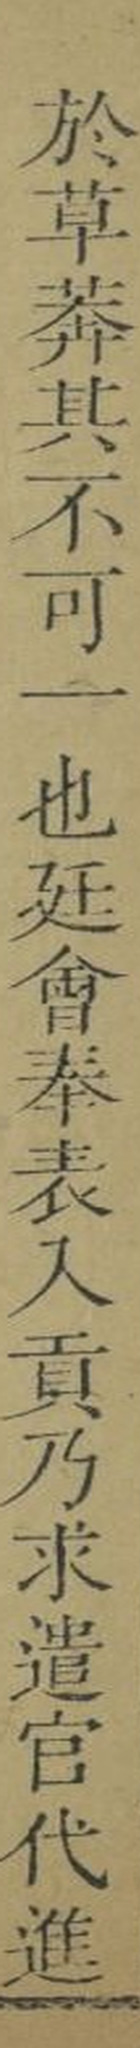於草莽其不可一也廷会奉表入貢乃求遣官代進
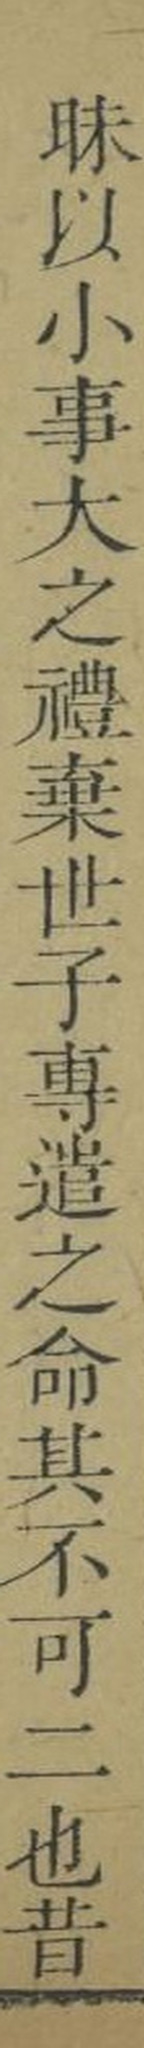昧以小事大之礼棄世子専遣之命其不可二也昔
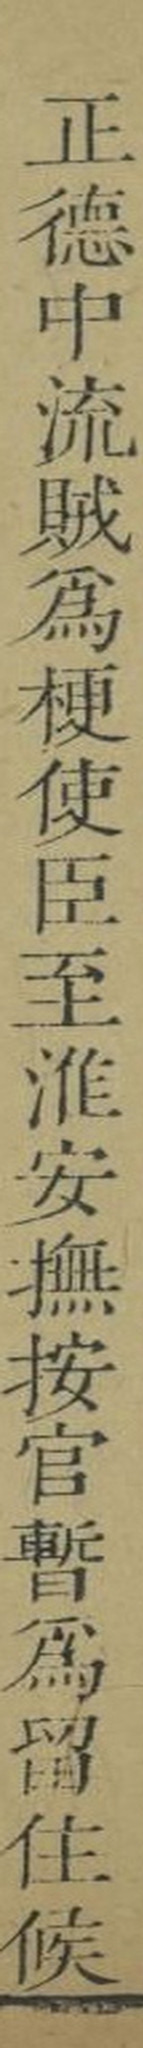正徳中流賊為梗使臣至淮安撫按官暫為留住候
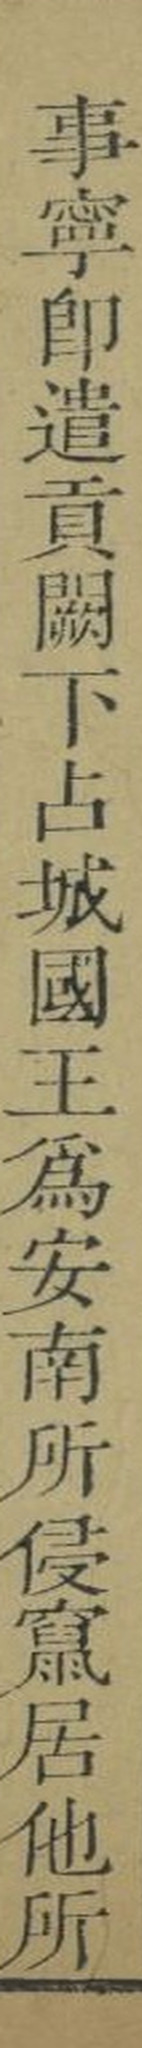事寧即遣貢闕下占城国王為安南所侵竄居他所
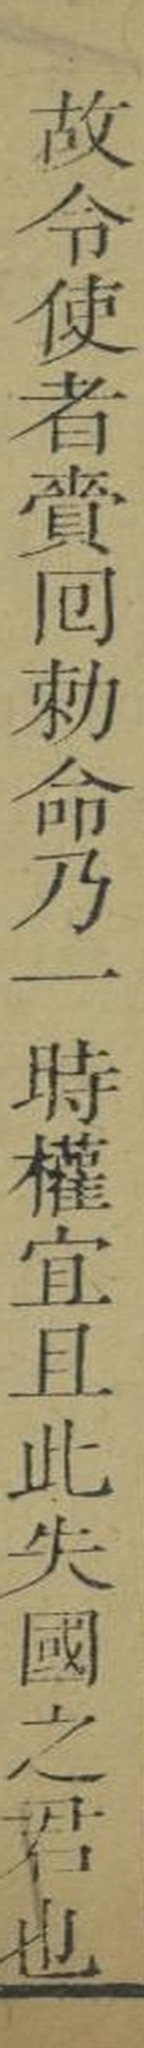故令使者賚回勅命乃一時権宜且此失国之君也
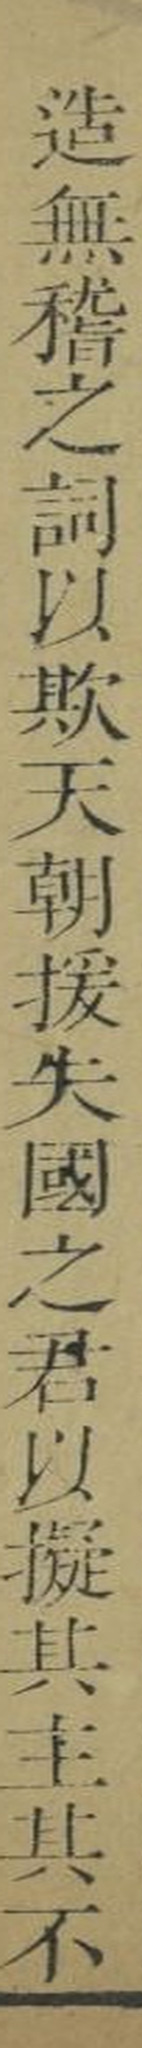造無稽之詞以欺天朝援失国之君以擬其主其不
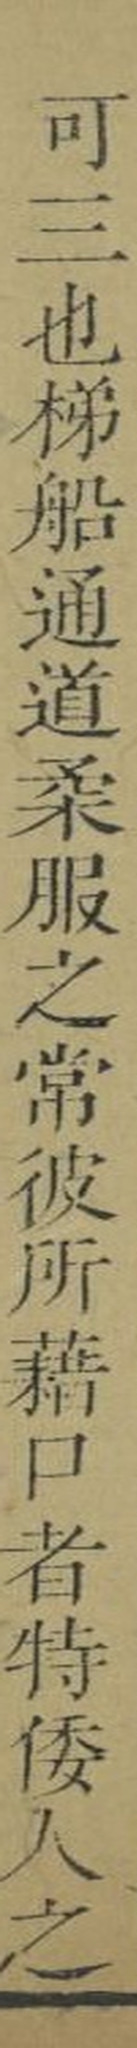可三也梯船通道柔服之常彼所藉口者特倭人之
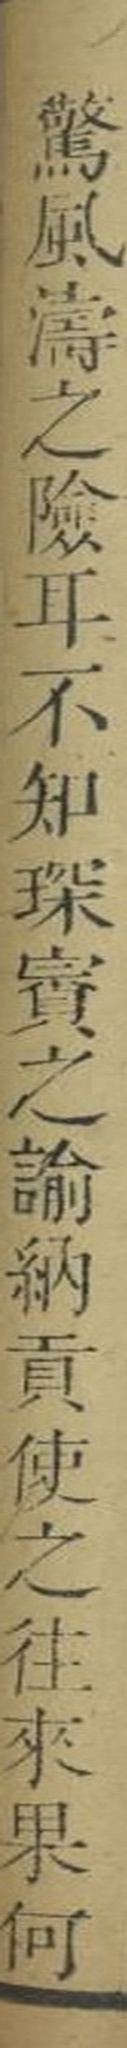驚風濤之険耳不知琛賨之諭納貢使之往来果何
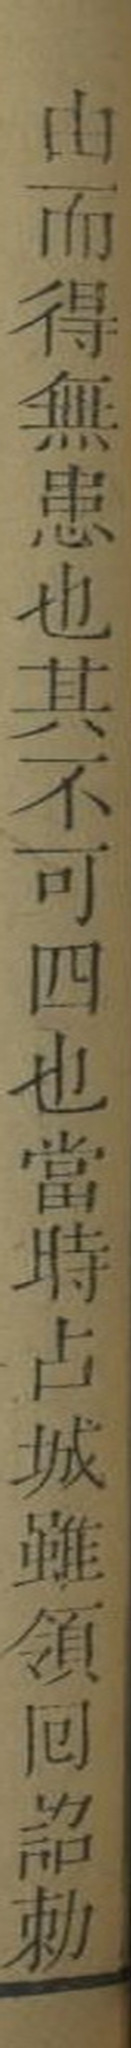由而得無患也其不可四也当時占城雖領回詔勅
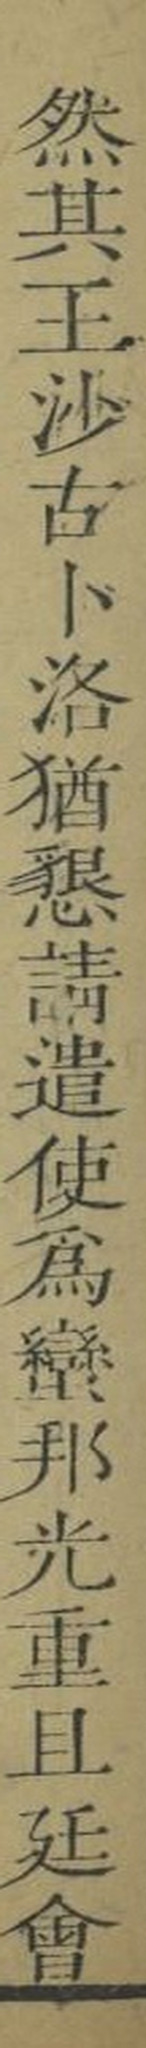然其王沙古卜洛猶懇請遣使為蛮邦光重且廷会
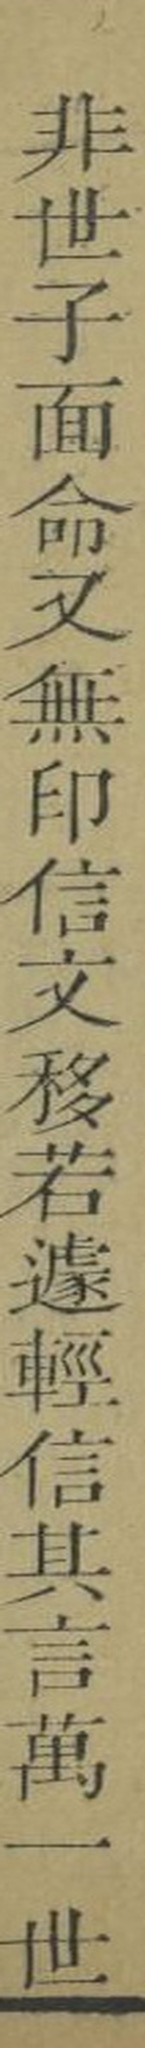非世子面命又無印信文移若遽軽信其言万一世
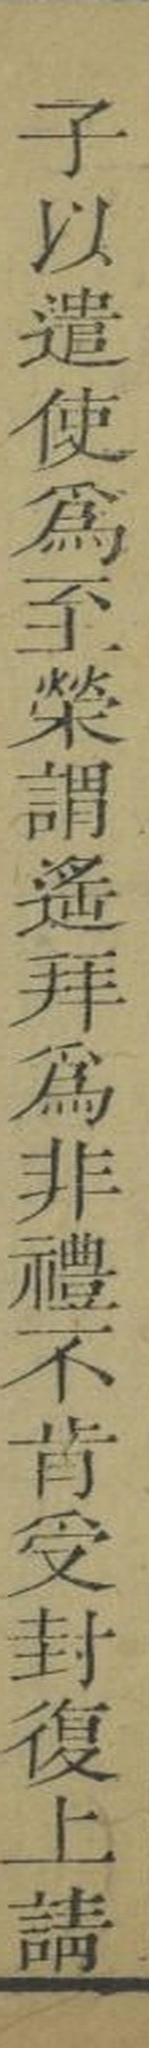子以遣使為至栄謂遥拝為非礼不肯受封復上請
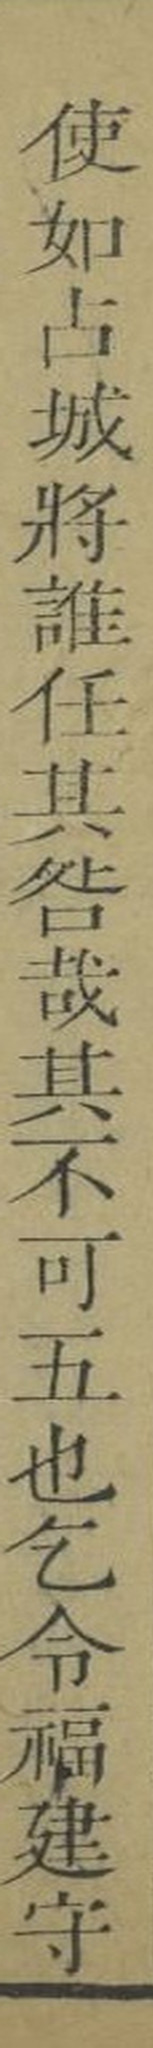使如占城将誰任其咎哉其不可五也乞令福建守
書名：中山伝信録 巻三
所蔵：University of the Ryukyus Library
